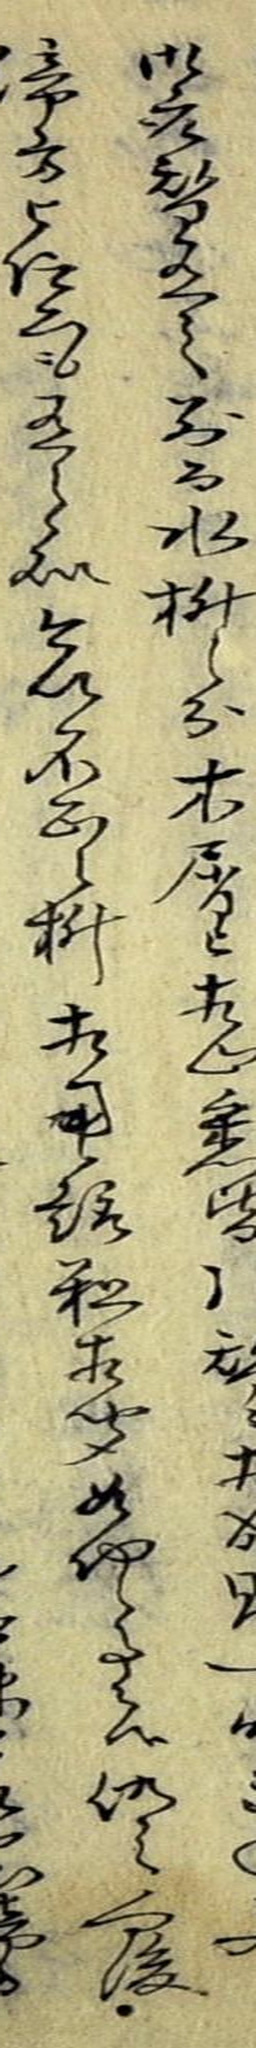締方被仰出候も有之候処今以不正之枡相用候趣粗相聞如何之事に候仍之向後
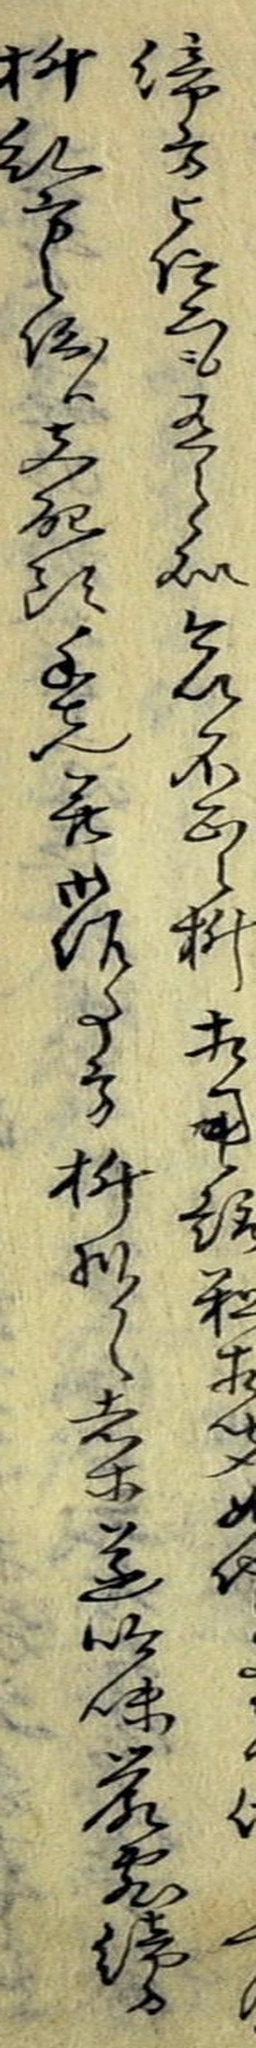枡糺方之儀は支配頭手先并御作事方枡掛り之者等遂吟味厳敷締方
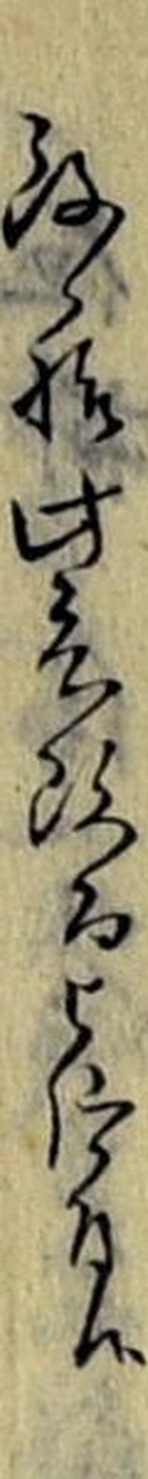致候様此度改而被仰付候

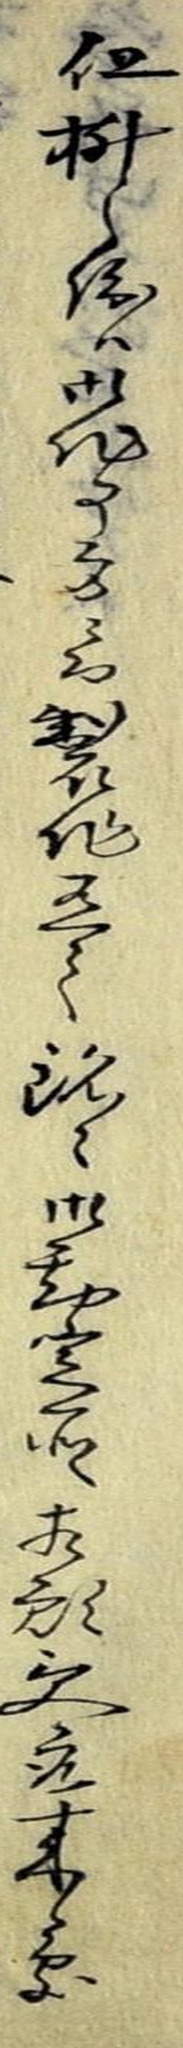但枡之儀は御作事方に而製作有之銘々御勘定所へ相願受取置来候処
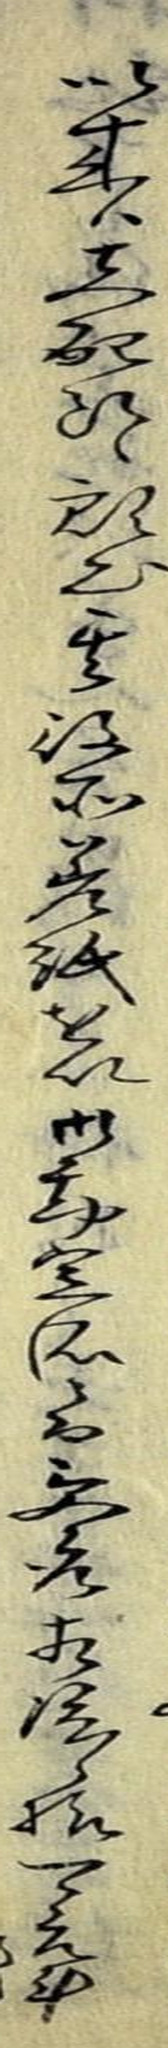以來は支配頭へ願出其役所差紙を以御勘定所に而受取相渡候様可取斗候
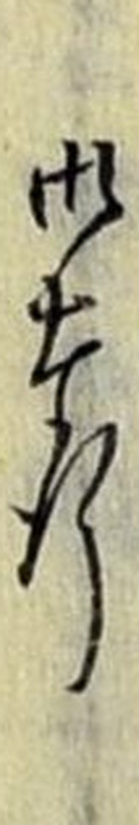御奉行
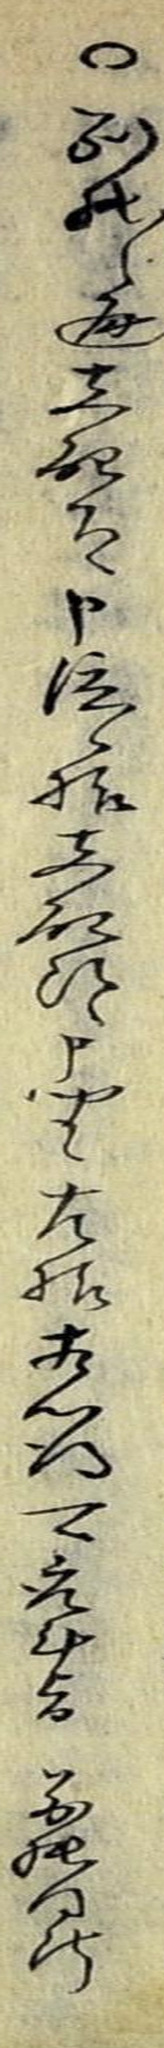○別紙之通支配下へ申渡候様支配頭へ申聞候左様相心得可取斗候
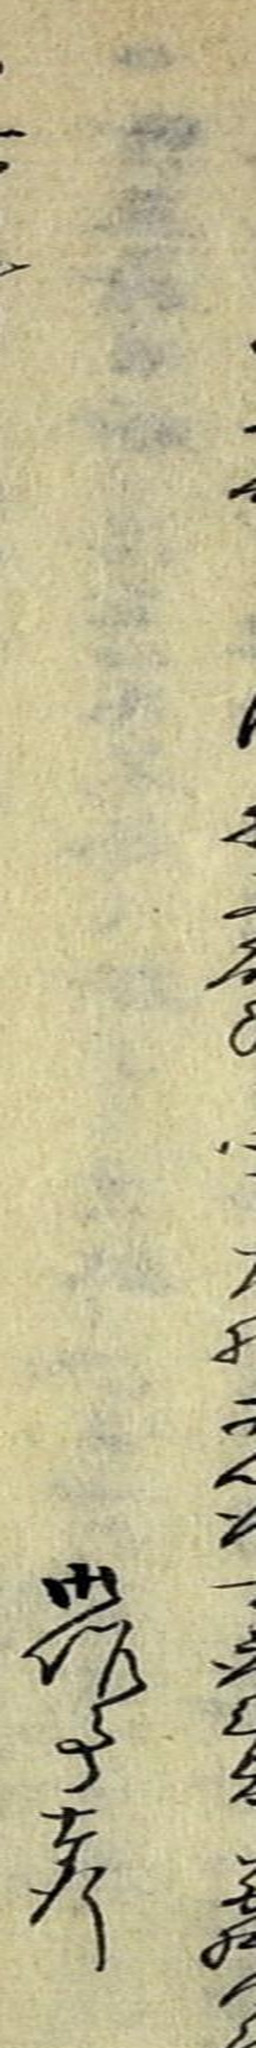御作事奉行
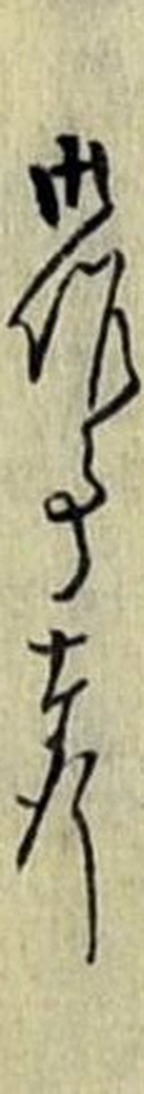御作事奉行
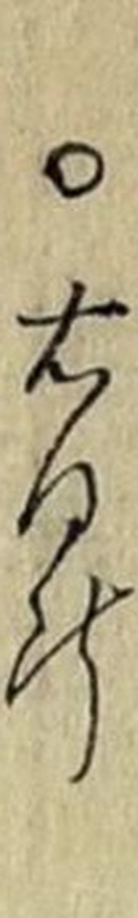○右同断
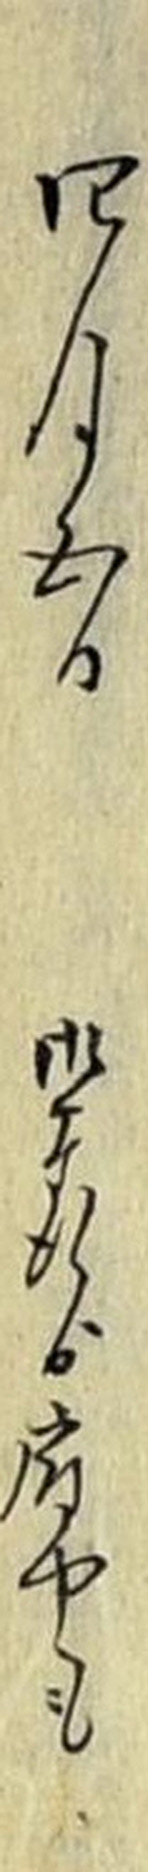四月五日御奉行ゟ府中へも
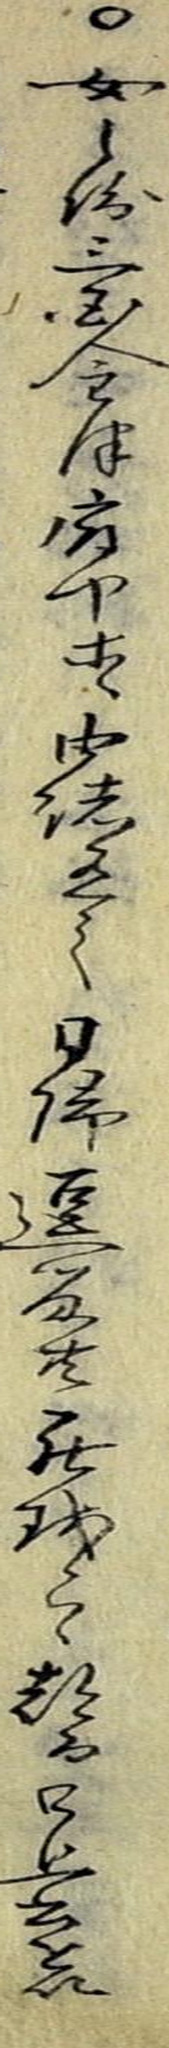○女之儀三国金津府中等へ由緒有之日帰逗留共罷越候はヽ都而口上書を以
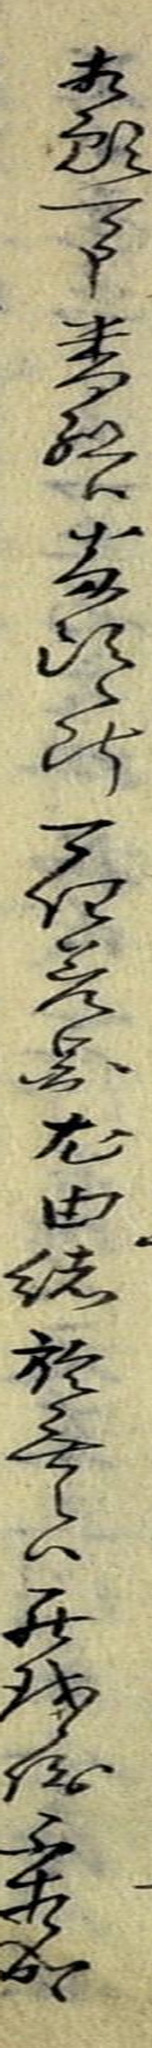相願可申番組は番頭へ断可任差図尤由緒於無之は罷越儀不相成事
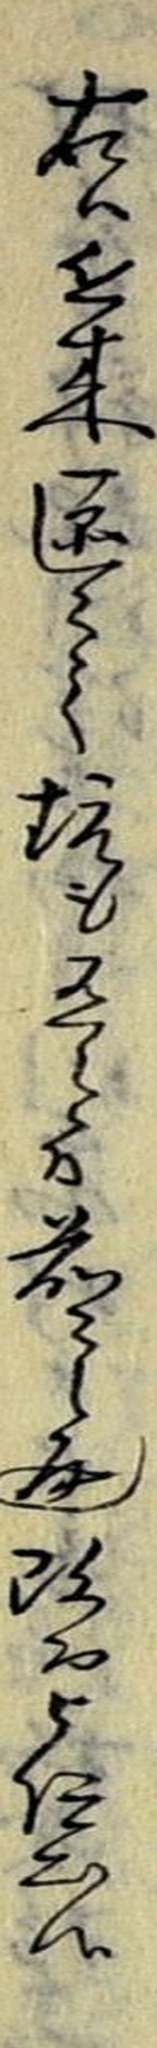右は近来区々之趣も有之に付前々之通改而被仰出候
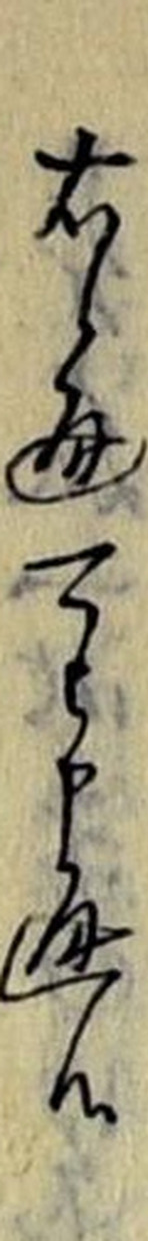右之通可被申通候
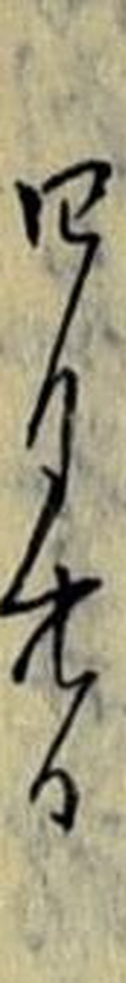四月廿日
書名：命令之部 六
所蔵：福井県文書館 Fukui Prefectural Archives
